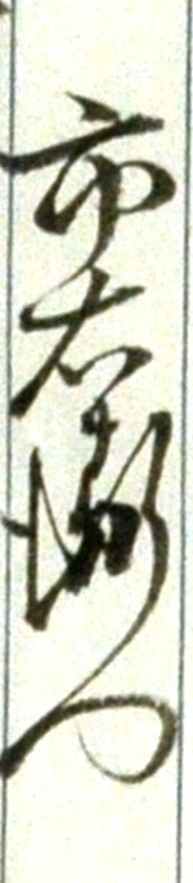吉右衛門
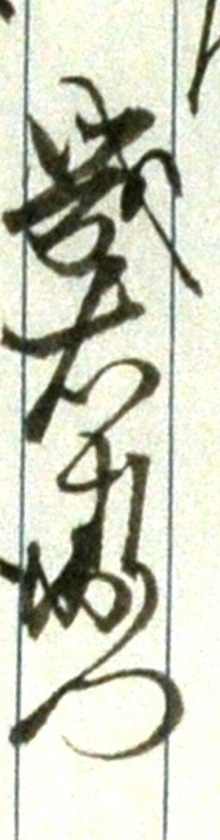吉右衛門
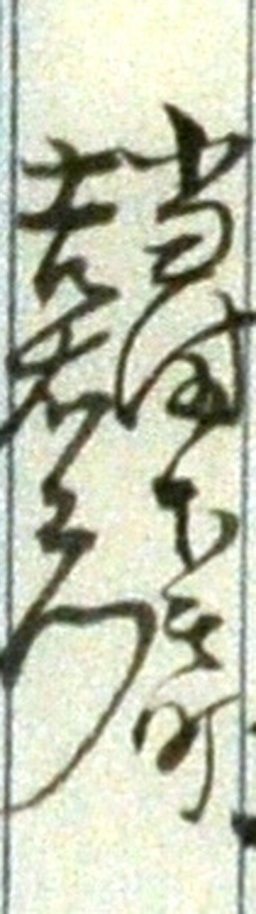吉右衛門
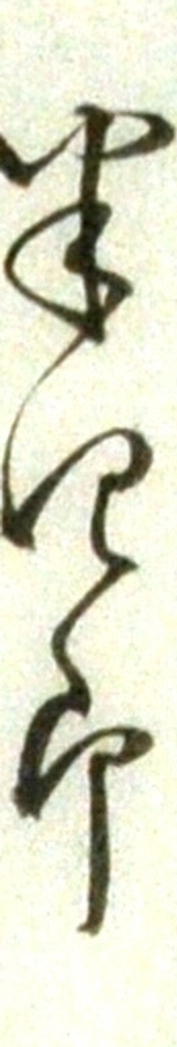半四郎
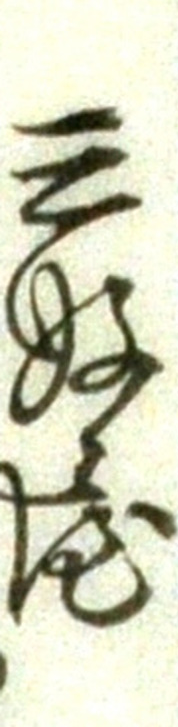三好屋
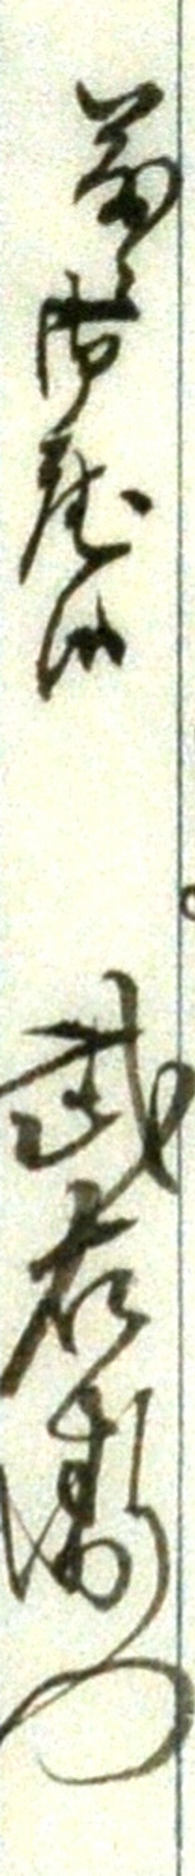前々御座候武右衛門
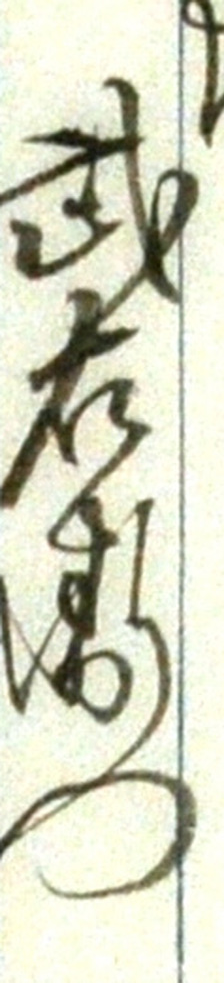吉右衛門
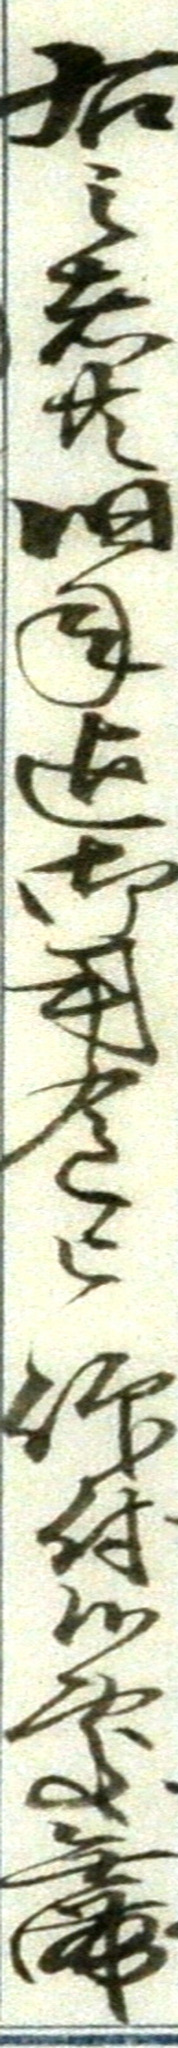右之者共旧年迄御用達被仰付候処無滞
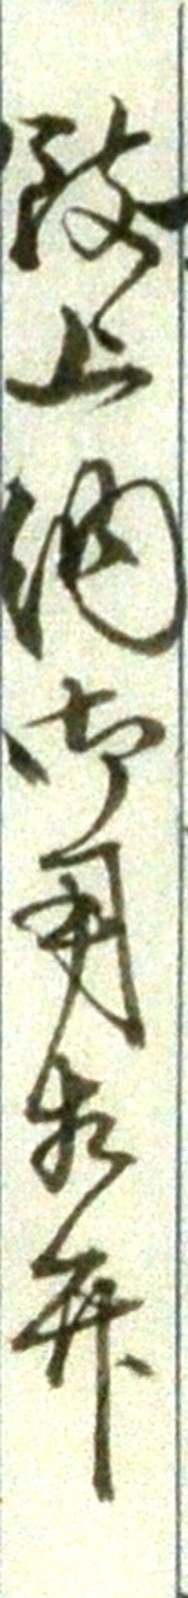致上納御用相弁
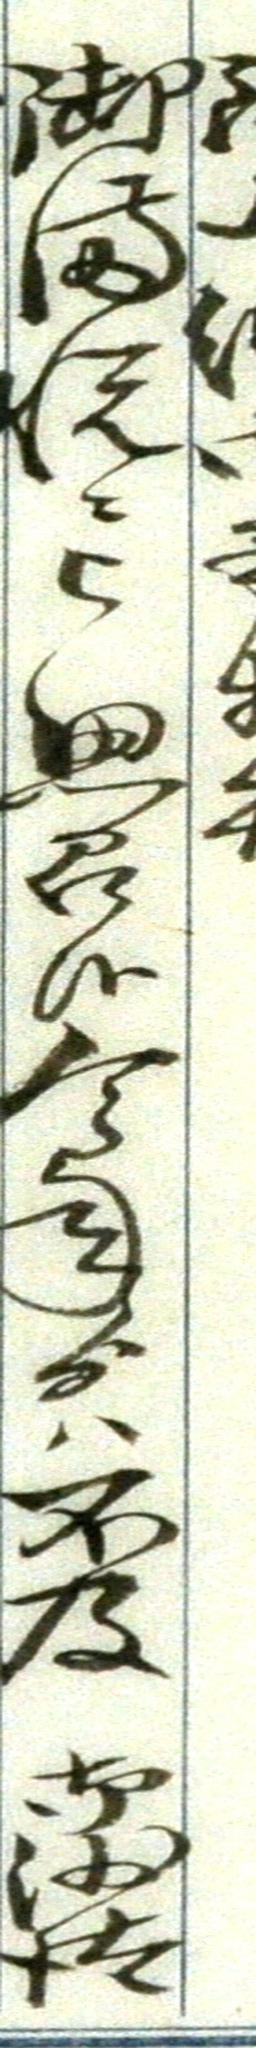御満悦ニ被思召候今年ゟハ不及御沙汰
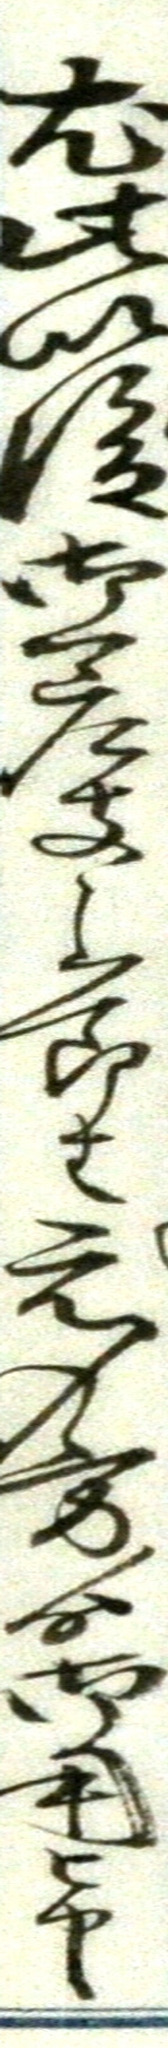尤此以後御差支之節者元〆方ゟ御用被申
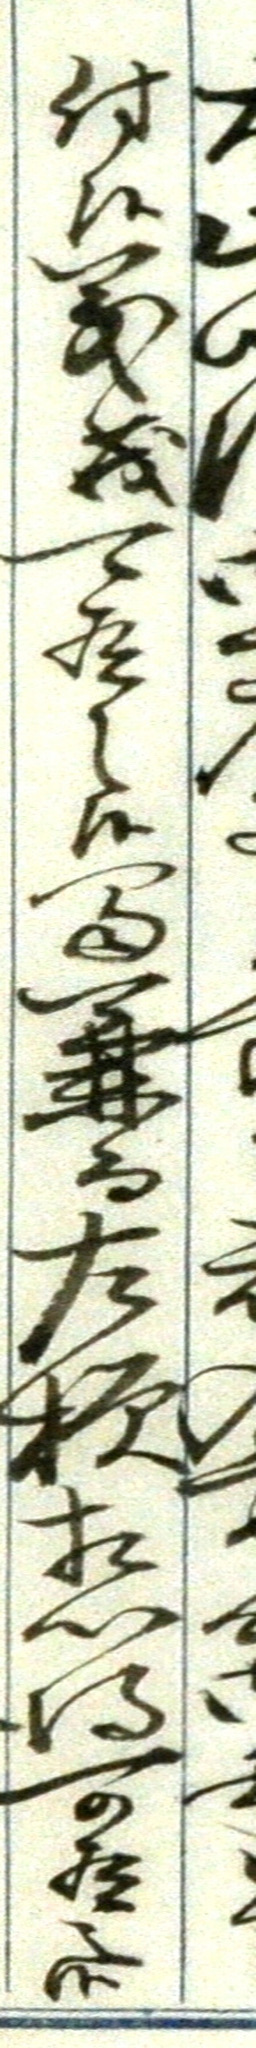付候義茂可有之候間兼而左様相心得可有之候
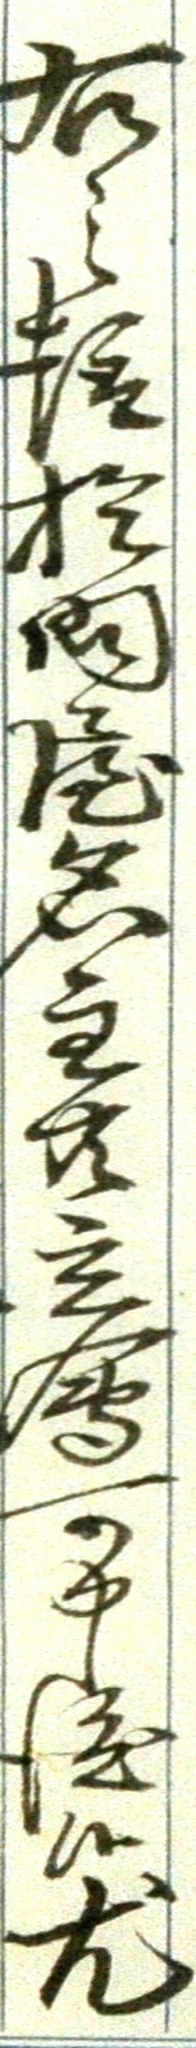右之趣於問屋名主共立会可申渡候尤
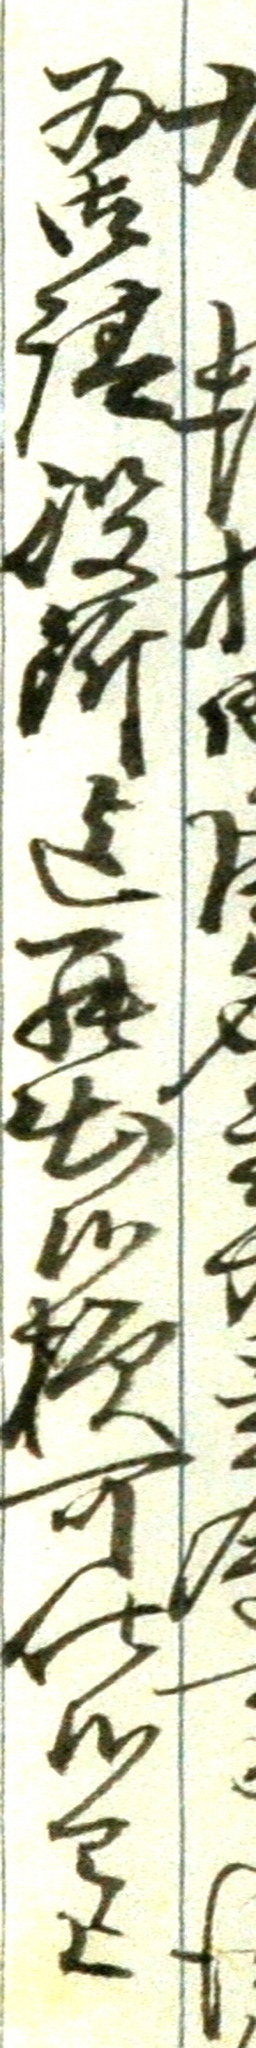為御請役所迄罷出候様可仕候已上

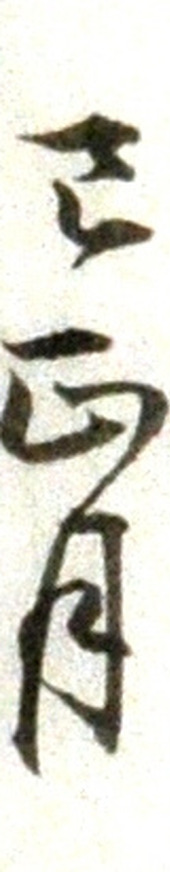巳正月
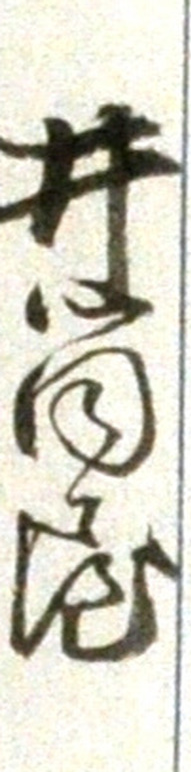井筒屋
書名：御拝地以来御用達相勤候者名前
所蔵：伊那市立高遠町図書館・合同会社AMANE
